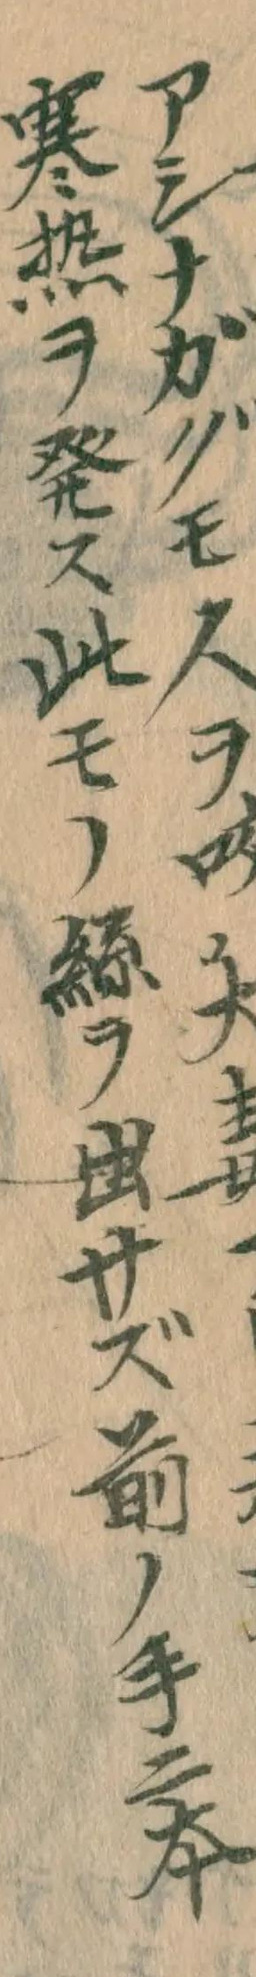寒熱ヲ発ス此モノ絲ヲ出サズ前ノ手二本
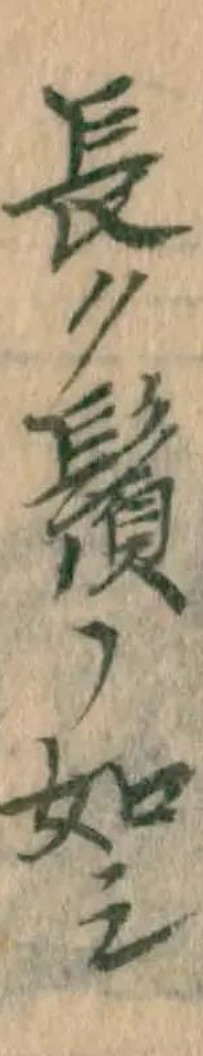長ク鬚ノ如シ
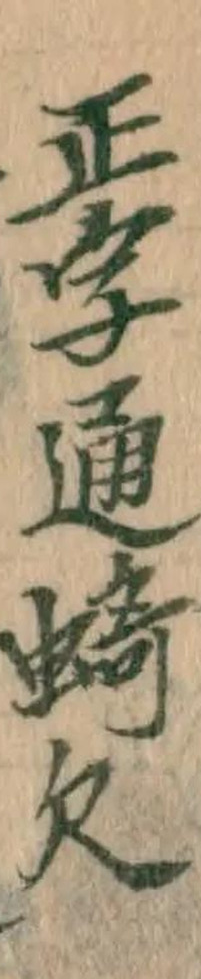正字通踦欠
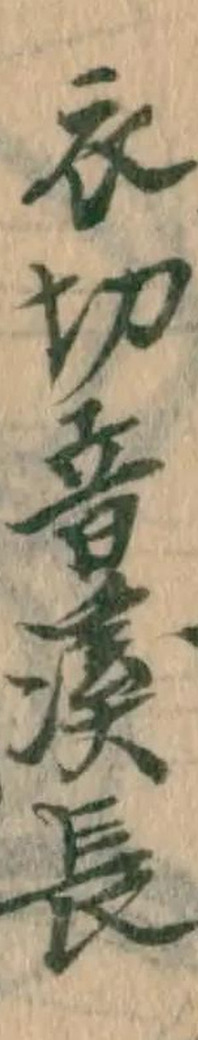衣切音溪長
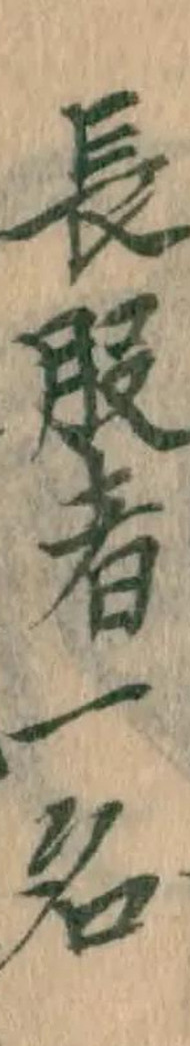長服者一名
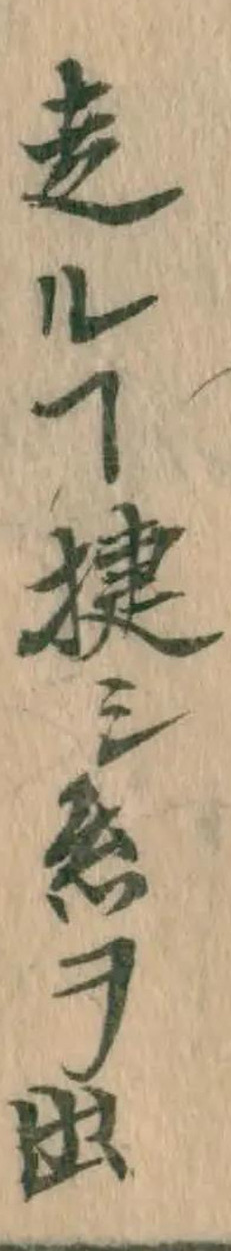走ルコト捷シ糸ヲ出
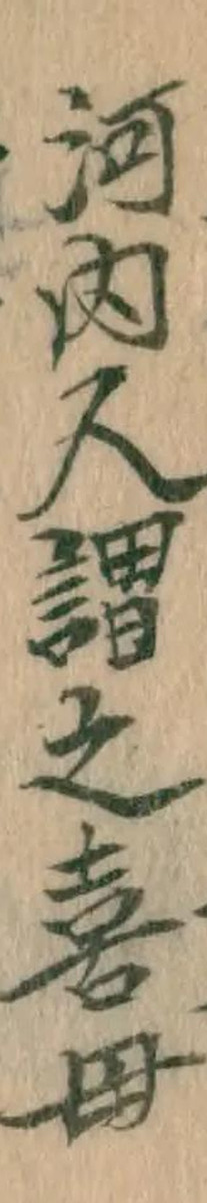河内人謂之喜母
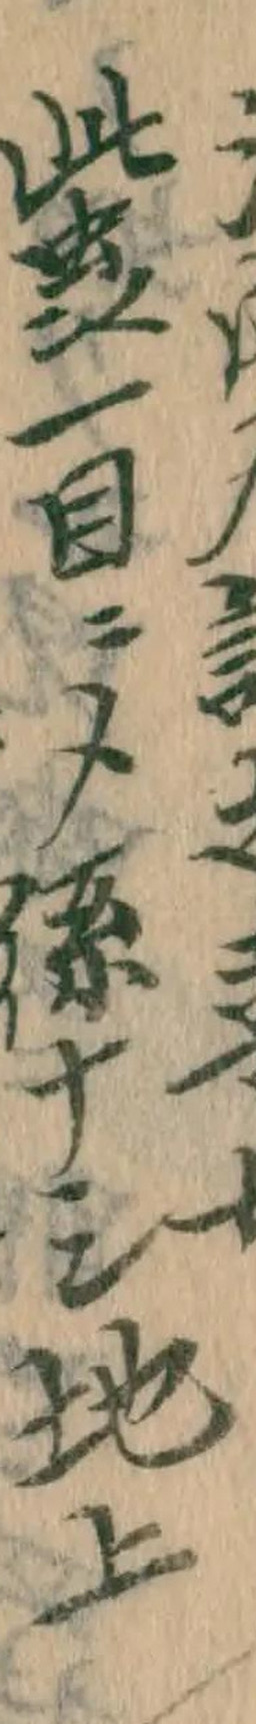此蟲一目ニシテ絲ナシ地上
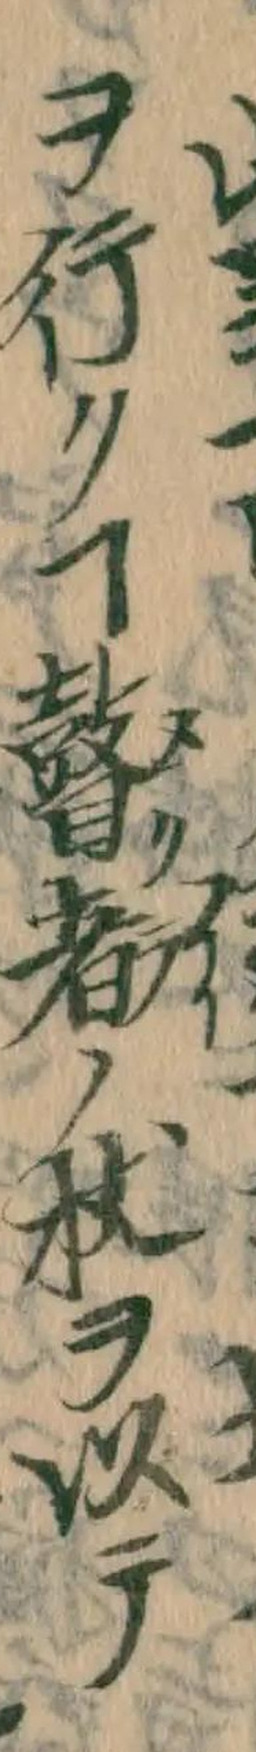ヲ行クコト瞽者ノ杖ヲ以テ
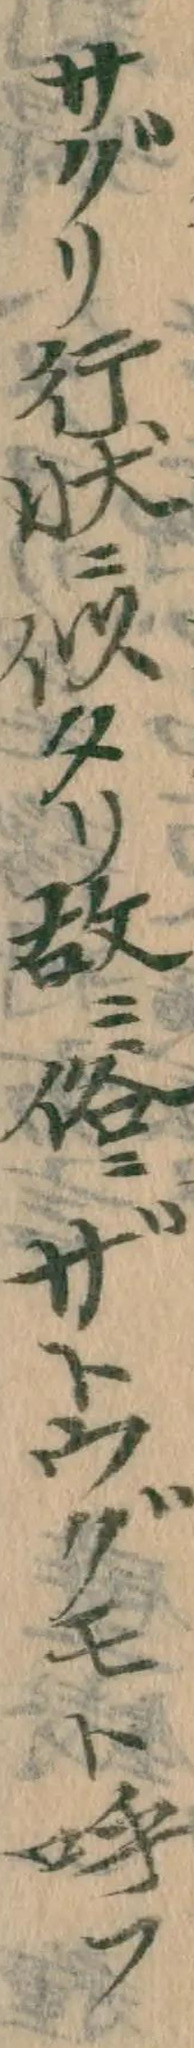サグリ行状ニ似タリ故ニ俗ニザトウグモト呼フ
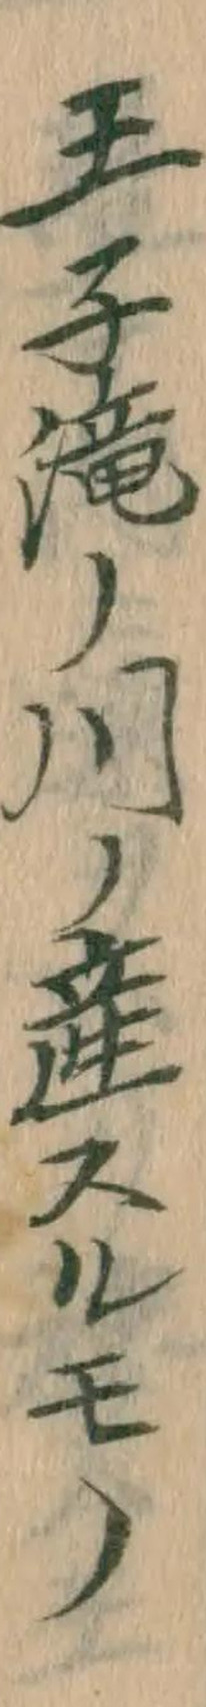王子滝ノ川ノ産スルモノ

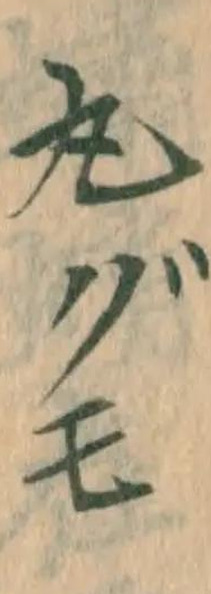丸グモ
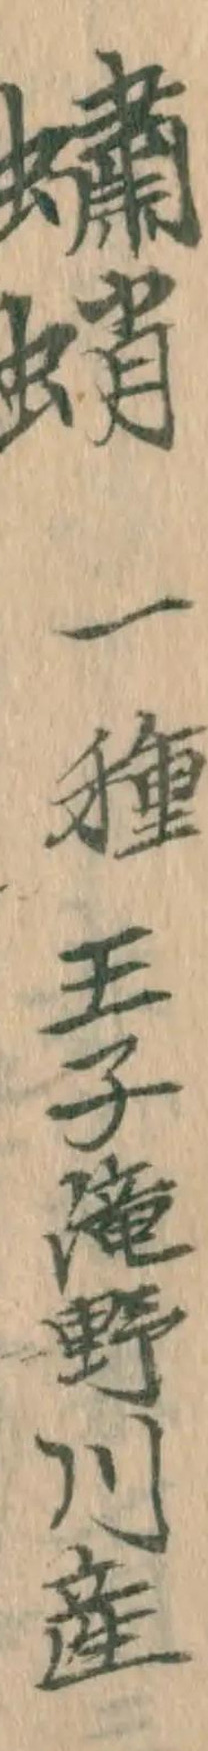蠨蛸一種王子滝野川産
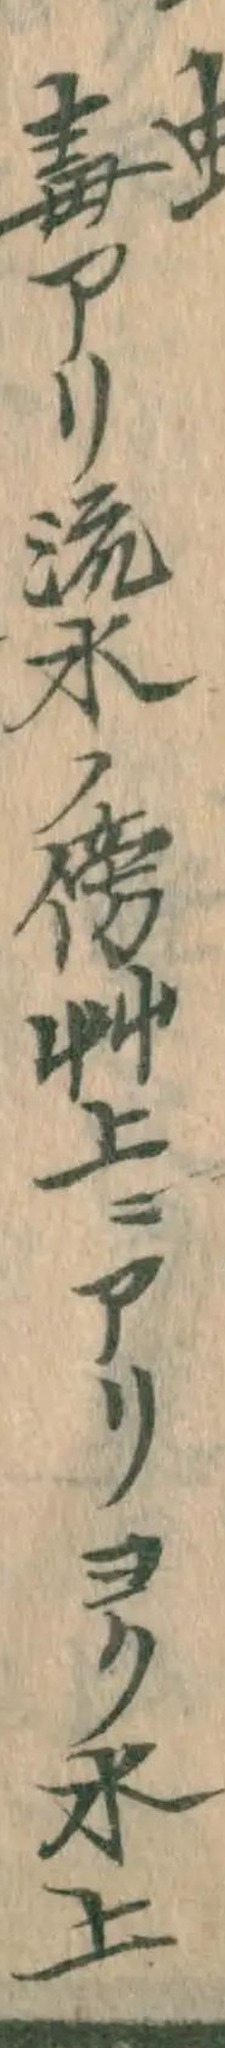毒アリ流水ノ傍艸上ニアリヨク水上
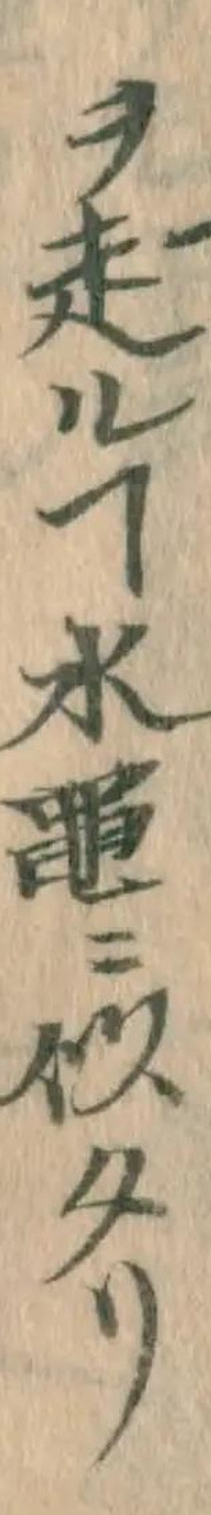ヲ走ルコト水黽ニ似タリ
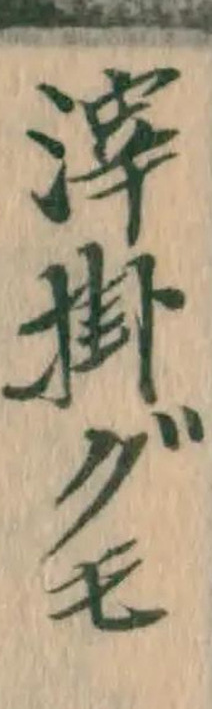滓掛グモ
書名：千蟲譜 3巻. [2]
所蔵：国立国会図書館 National Diet Library, JAPAN
